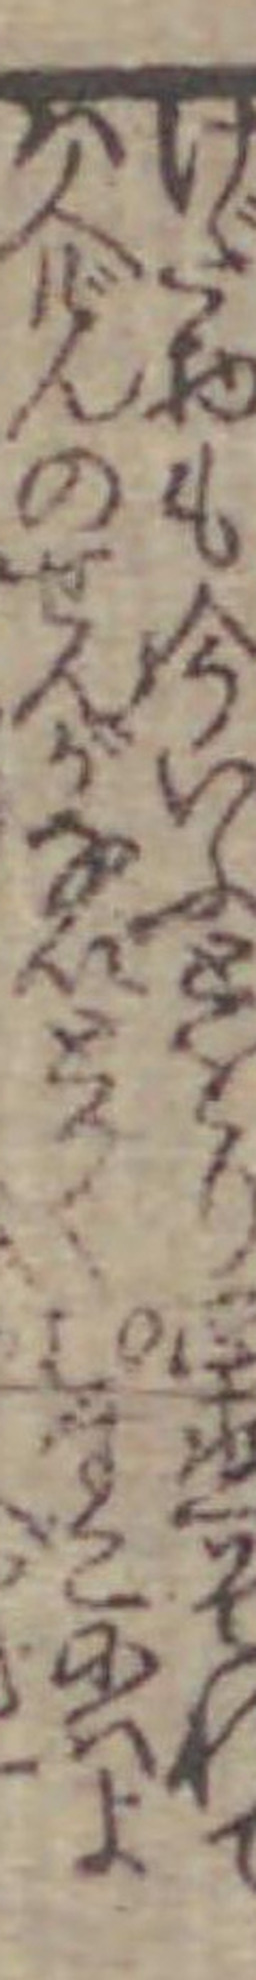は人げんのせんがないとかくむすこにはよ
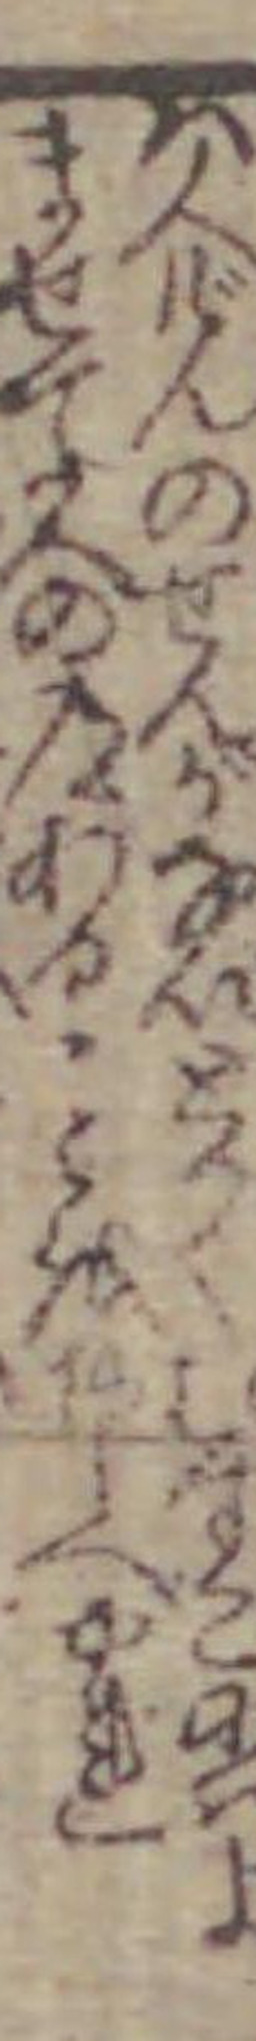ませて人の道あることをおしへやれ
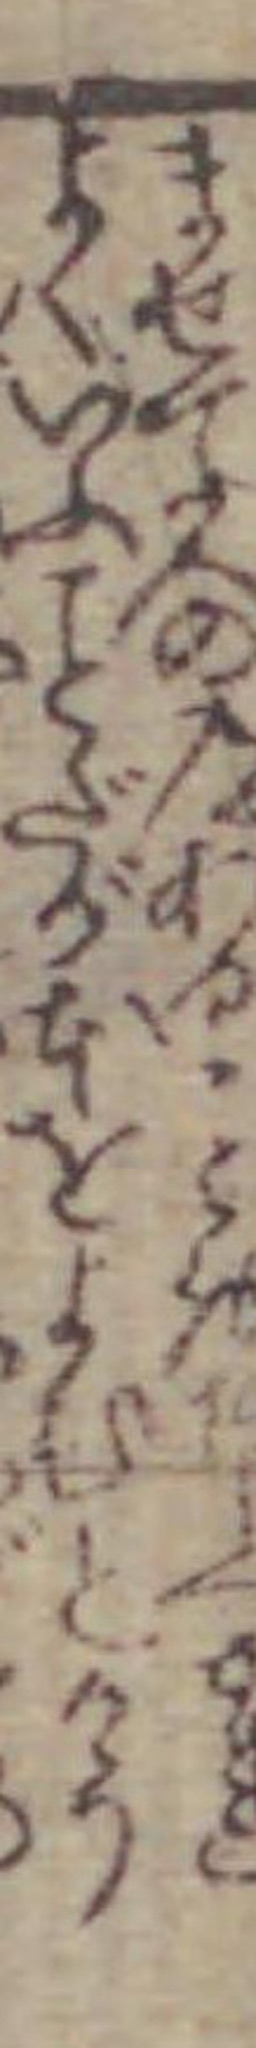よくいふことだが本をよむとかう
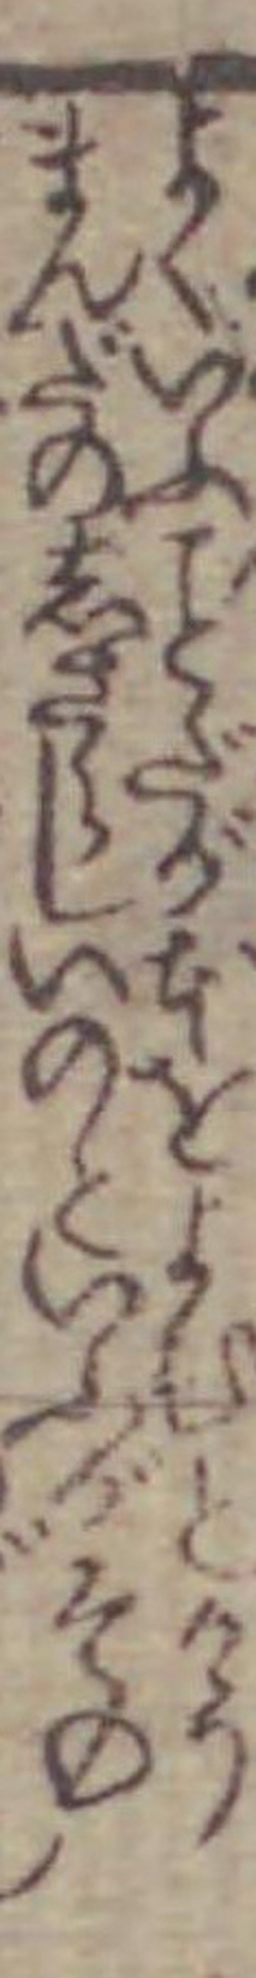まんだのしさらしいのといふがその
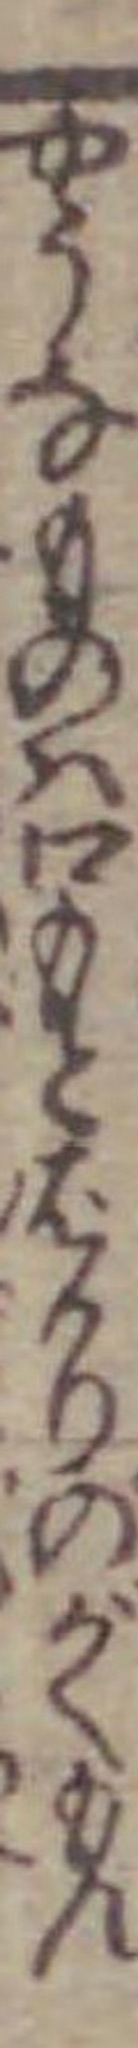やうなものは口もとばかりのがくもん
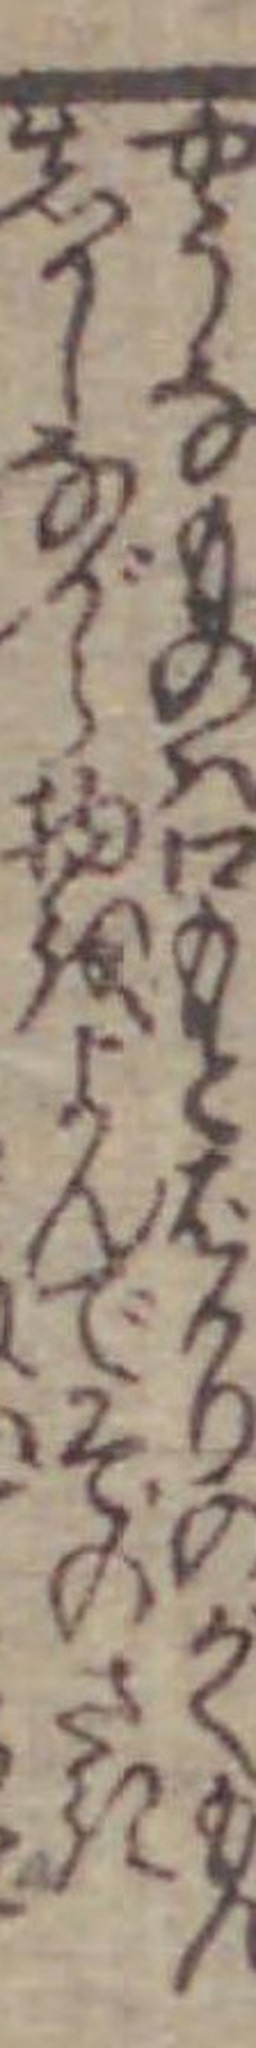しかしながら物をよんでそのさき
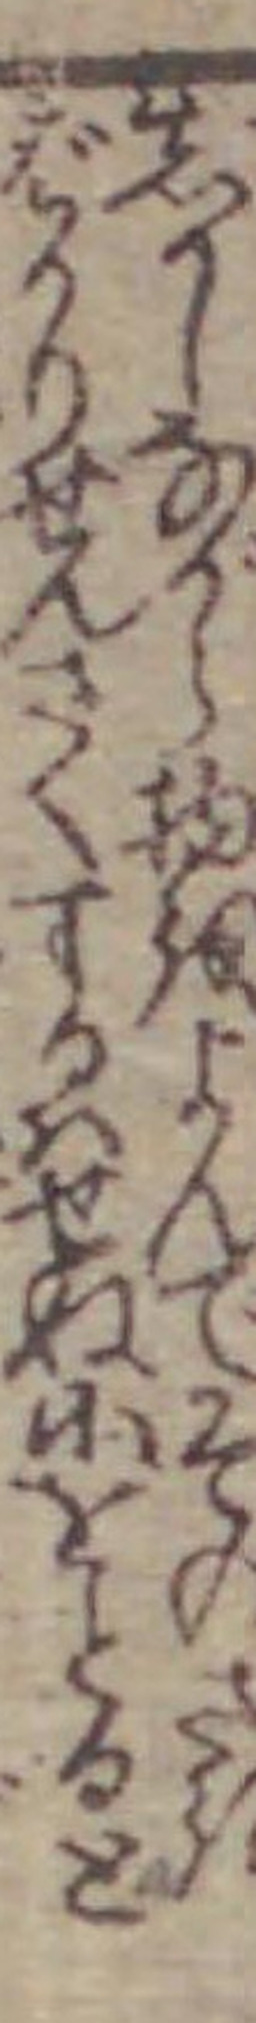ばかりせんさくするはせぬにおとると
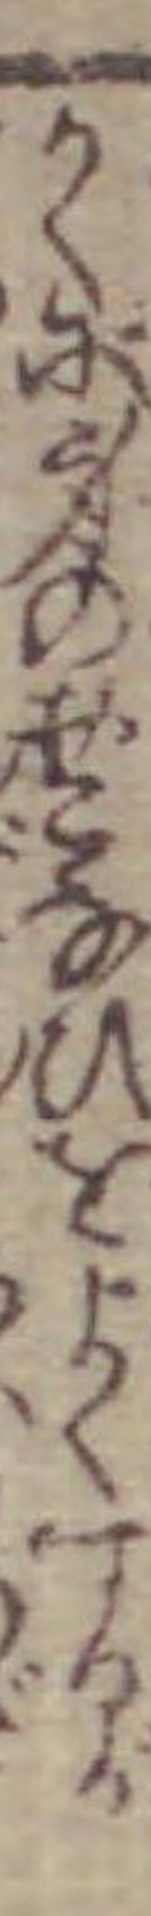かくに？身のおこなひをよくするが
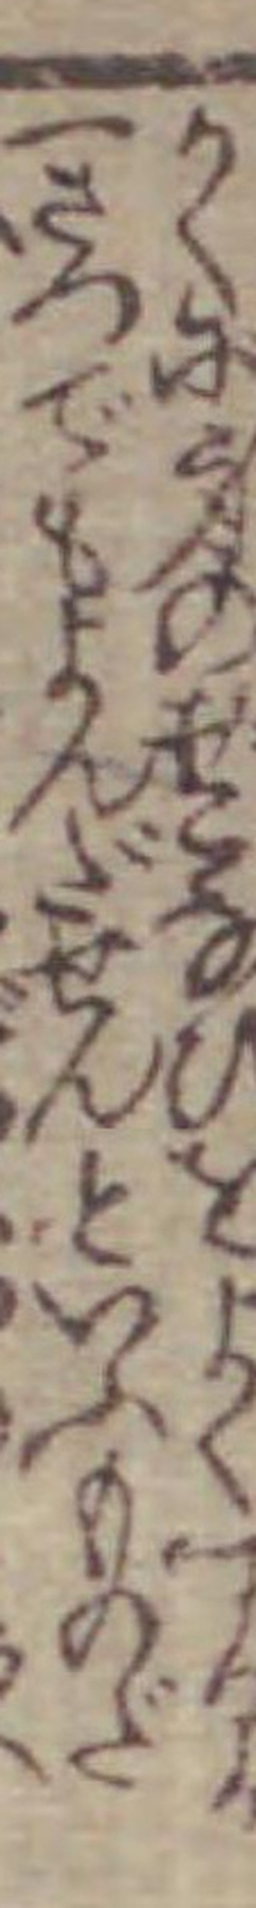一さつでもよんだせんといふものだ
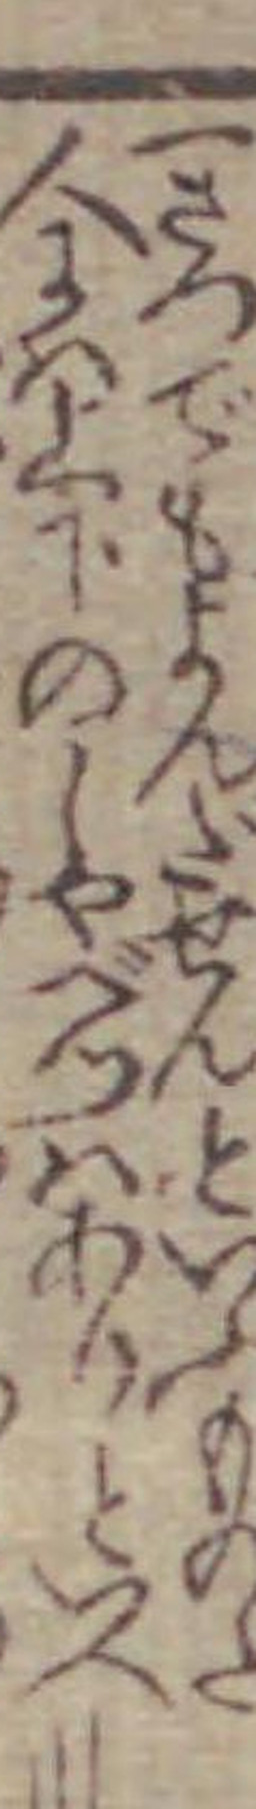人には上下のしやべつはありといへ
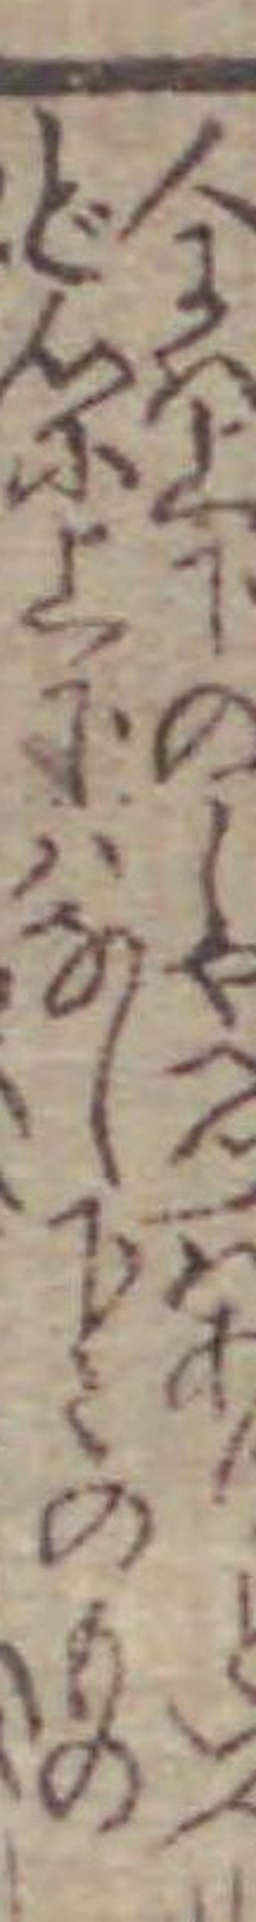ど心に上下はなし下々のもの
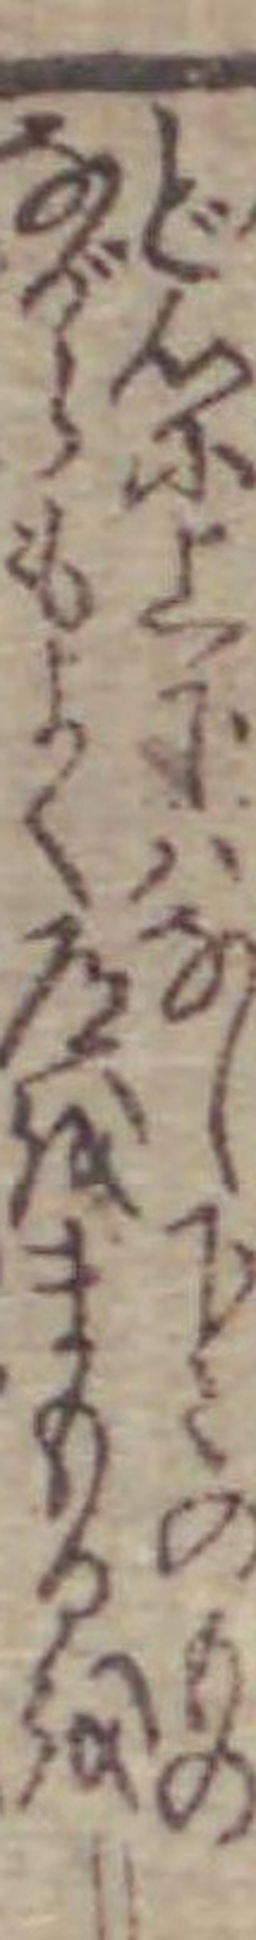ながらもよく道をまもるを
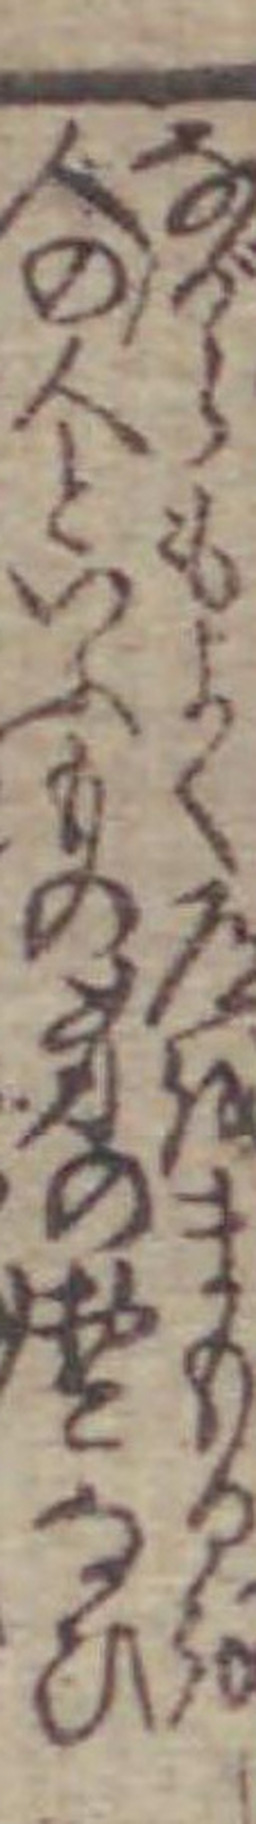人の人といふもの身のおこなひ
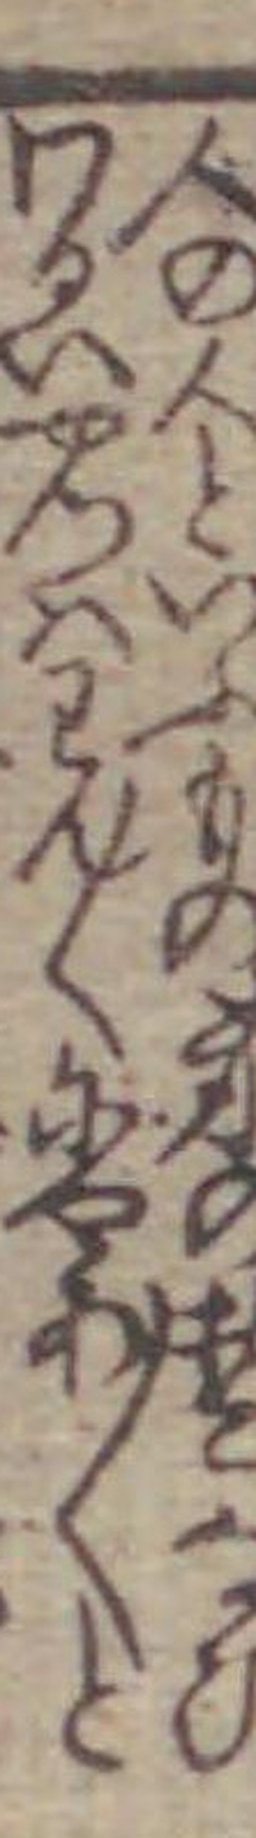わるいやつはわん〳〵にやあ〳〵と
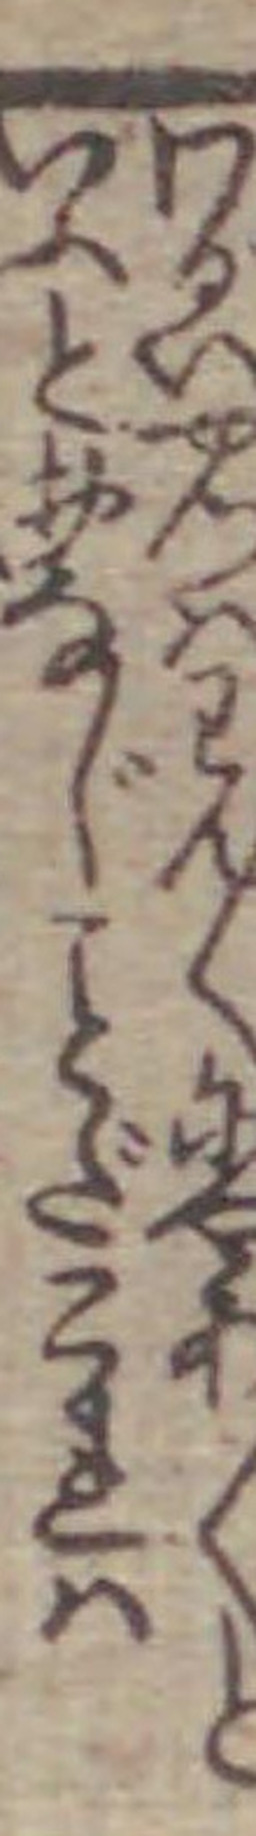いふとおなじことだこれは
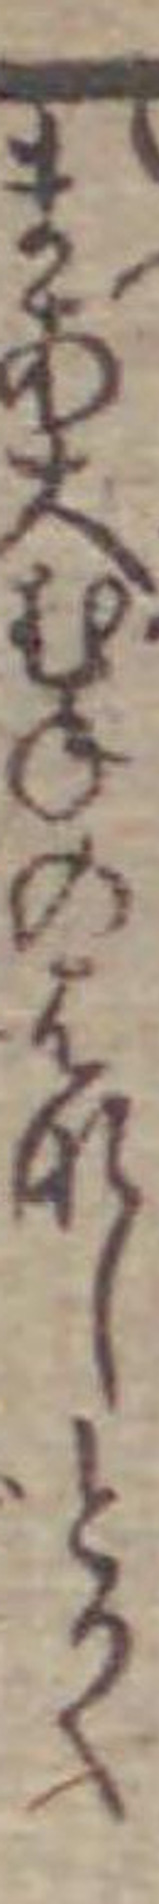まあ大むねのはなしとかく
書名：即席耳学問 : 3巻
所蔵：国立国会図書館 National Diet Library, JAPAN
